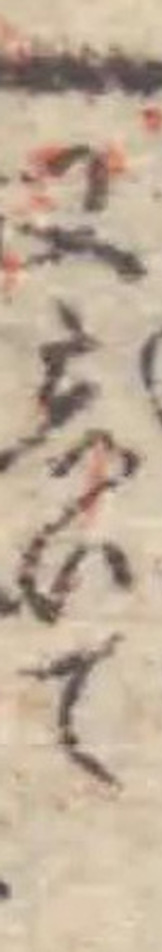又しいて
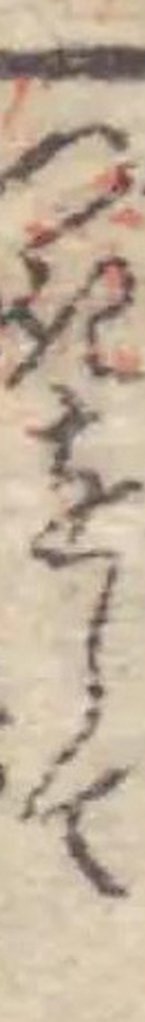つきをして
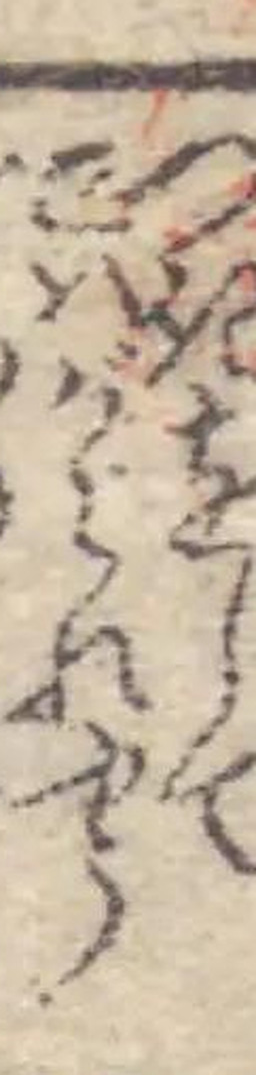こはがられやう
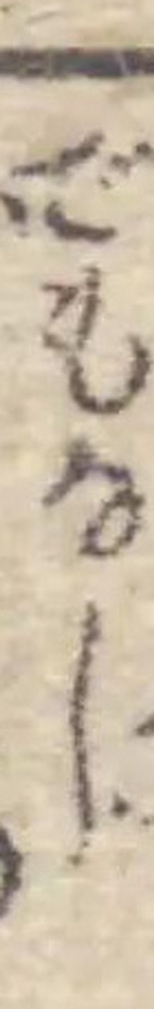でもなし
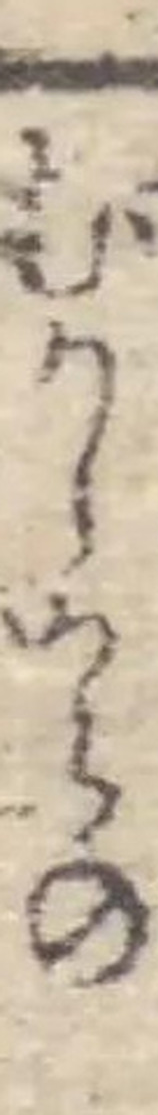むかしからの
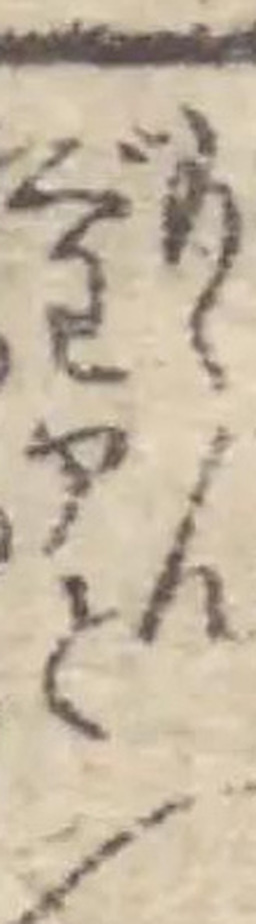ぐわァと
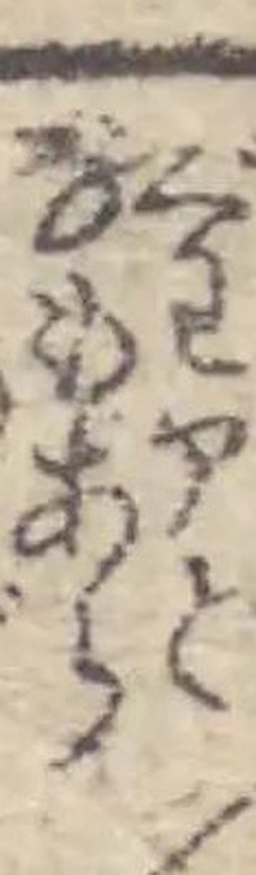なもあら
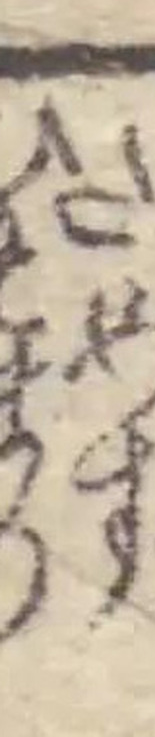ためず
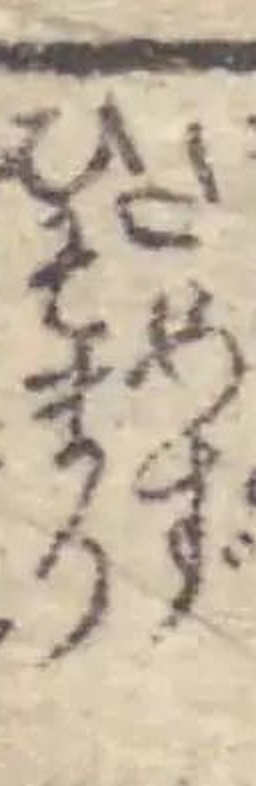ひそまり
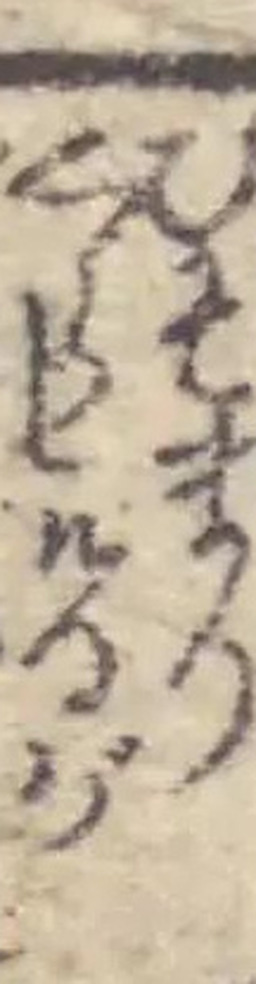くらしけるが
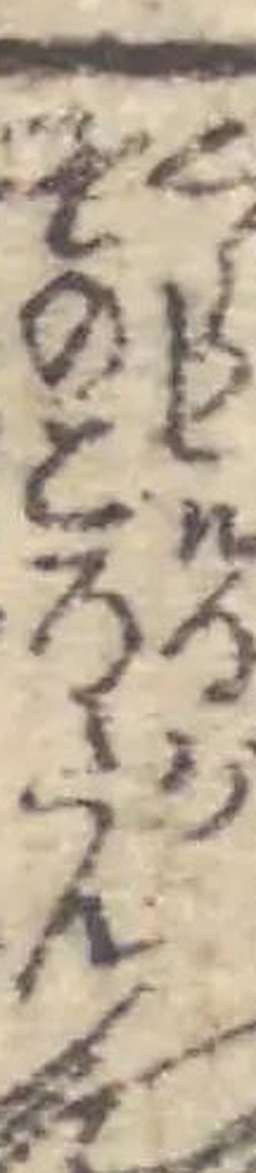そのころたん
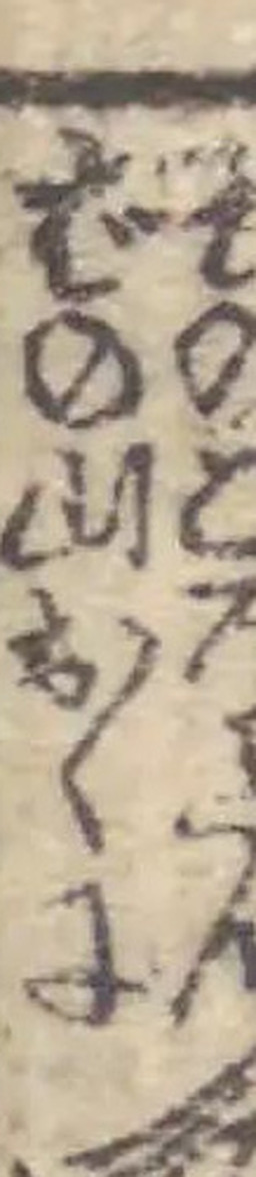ばの山おくに
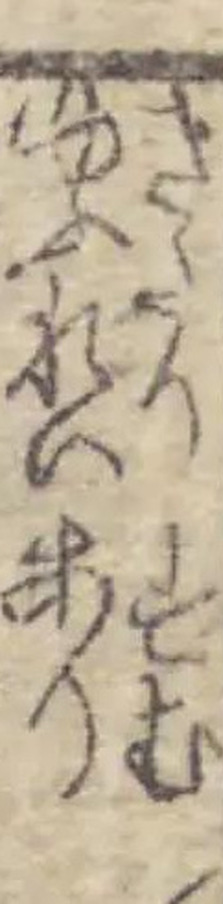ゆふれいあり
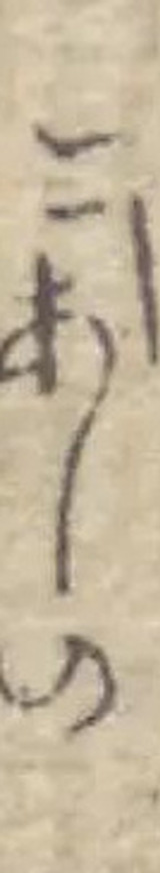〽あしの
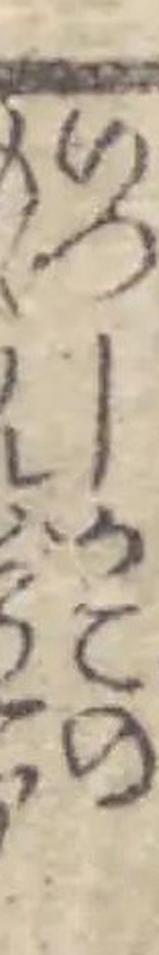いつしかこの
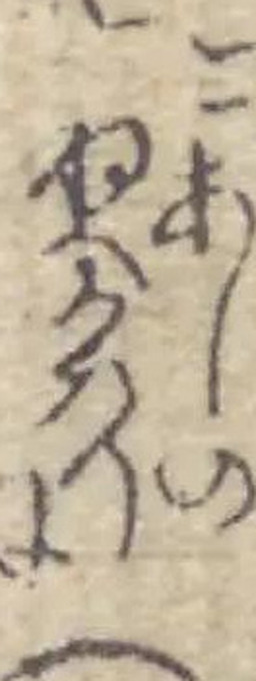ねへかはりに
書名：化物尽 4巻
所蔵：国立国会図書館 National Diet Library, JAPAN
